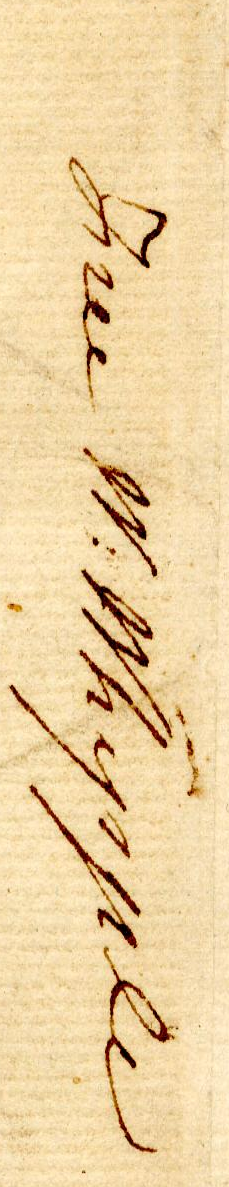per M^r Whipple
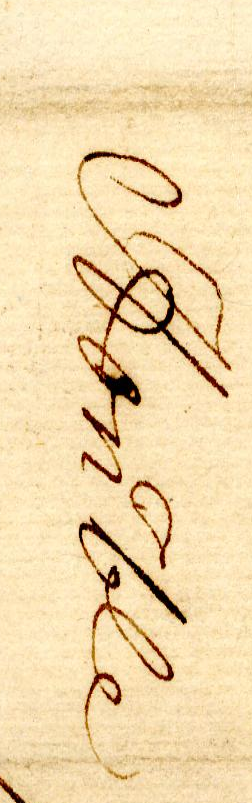Hon^rble
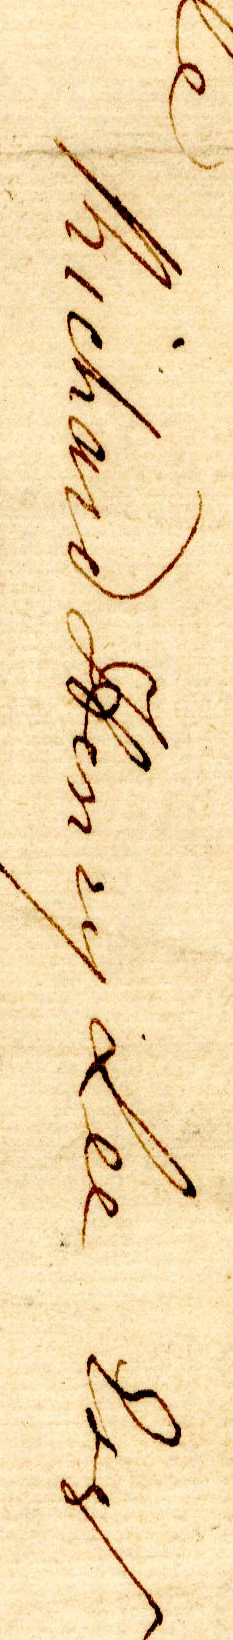Richard Henry Lee Esq^r
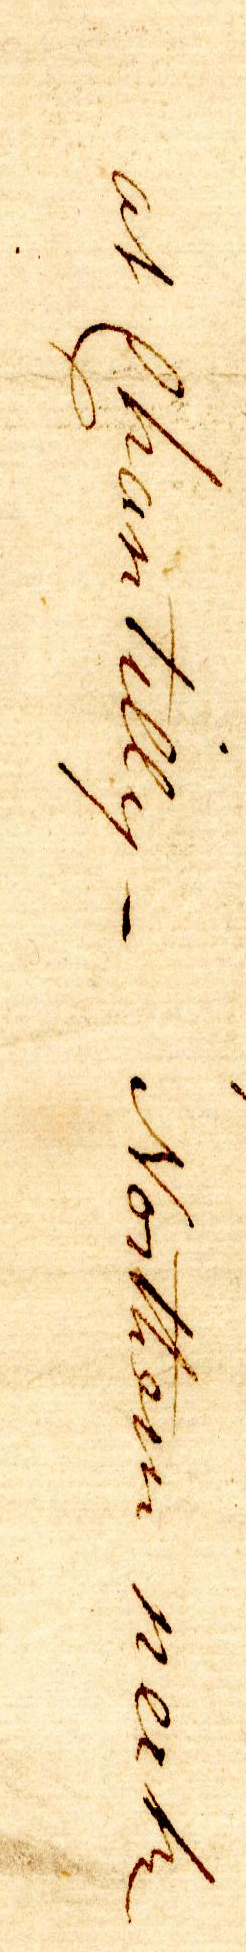at Chantilly- Northern neck
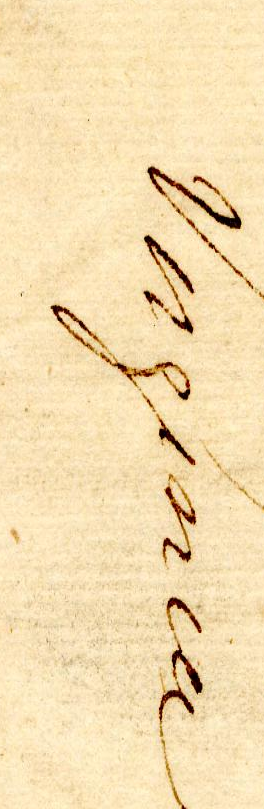Virginia
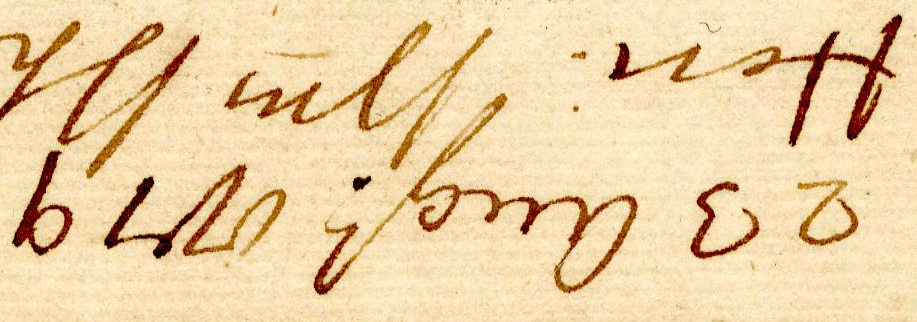23 Aug^t. 1779
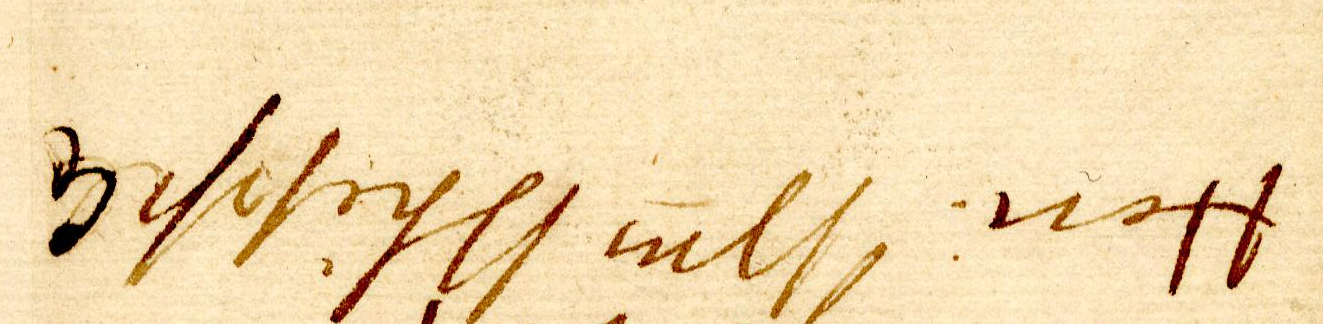Hon: M^r. Whipple
